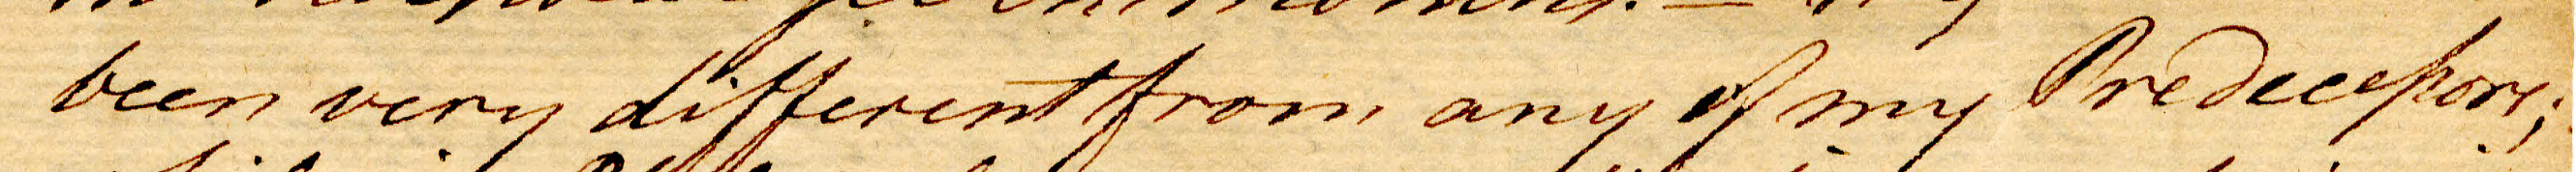been very different from any of my Predecessors;
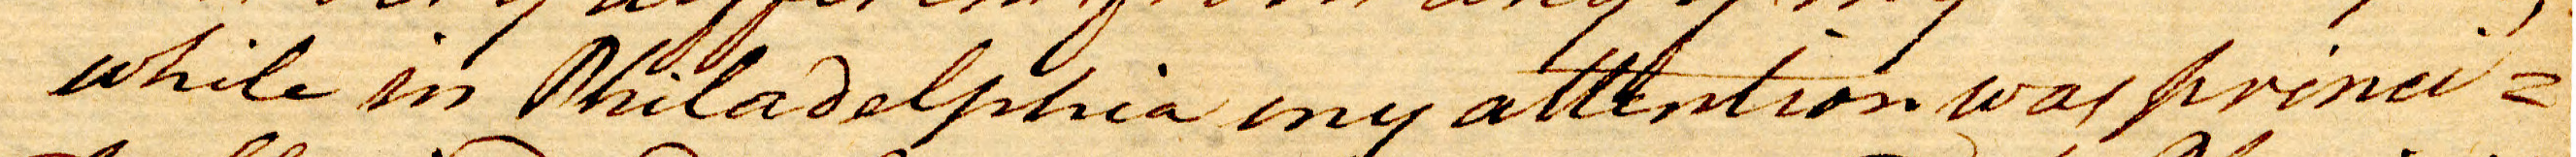while in Philadelphia my attention was princi-
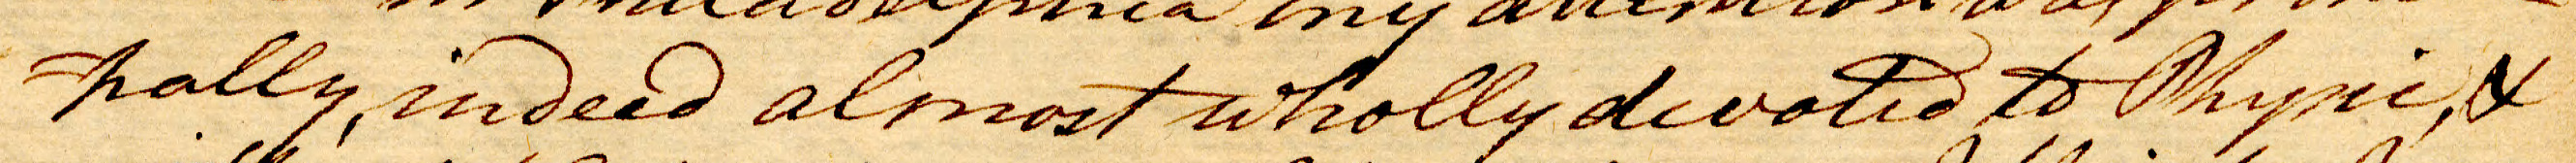-pally, indeed almost wholly devoted to Physic, &
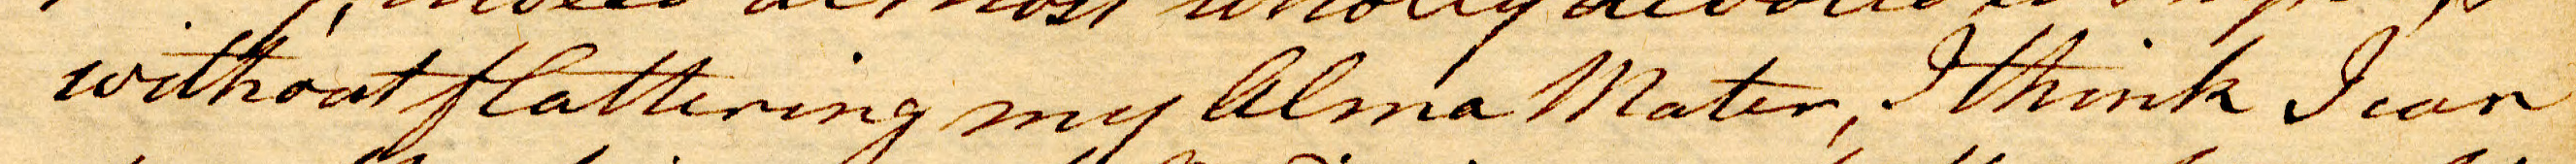without flattering my Alma Mater, I think I can
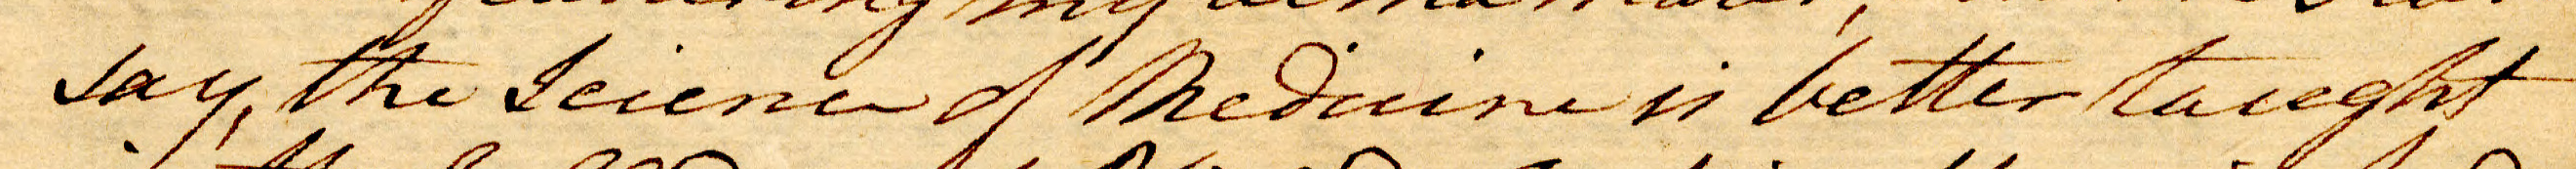say, the science of Medicine is better taught
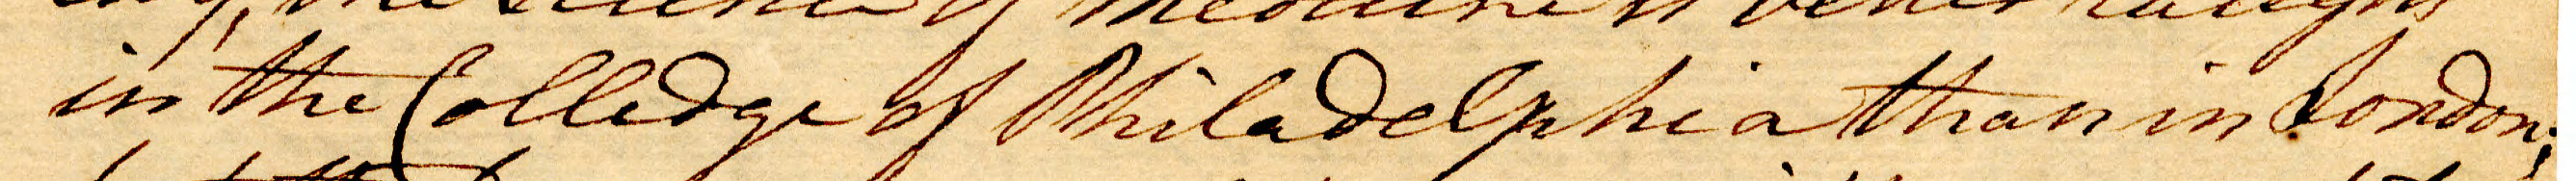in the College of Philadelphia than in London;
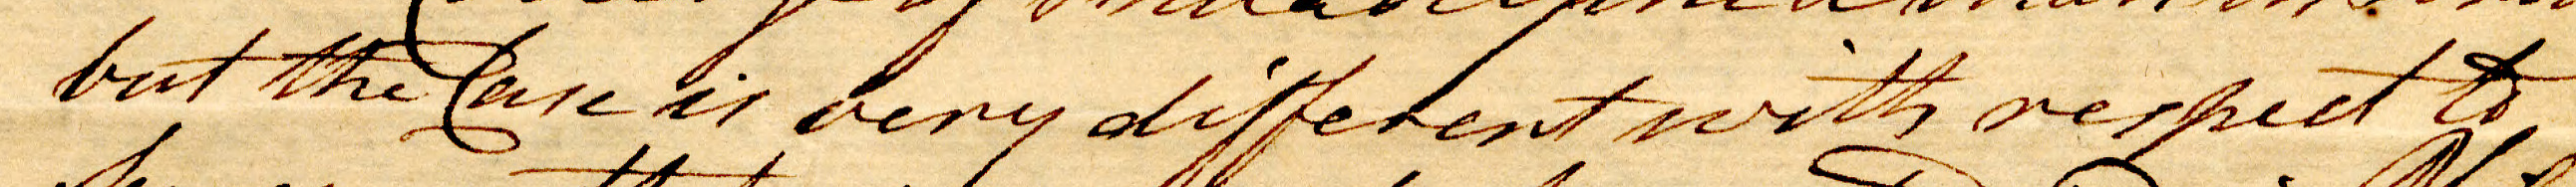but the Case is very different with respect to
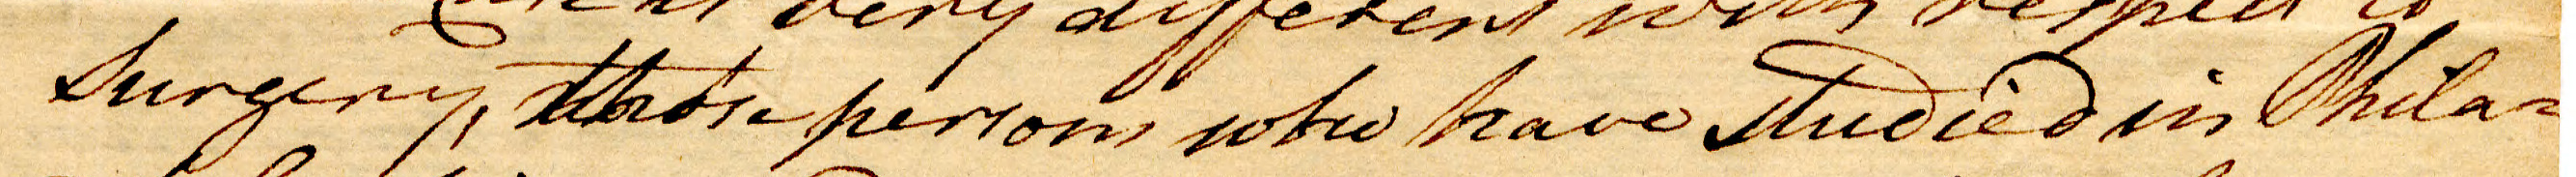Surgery, those persons who have studied in Phila-
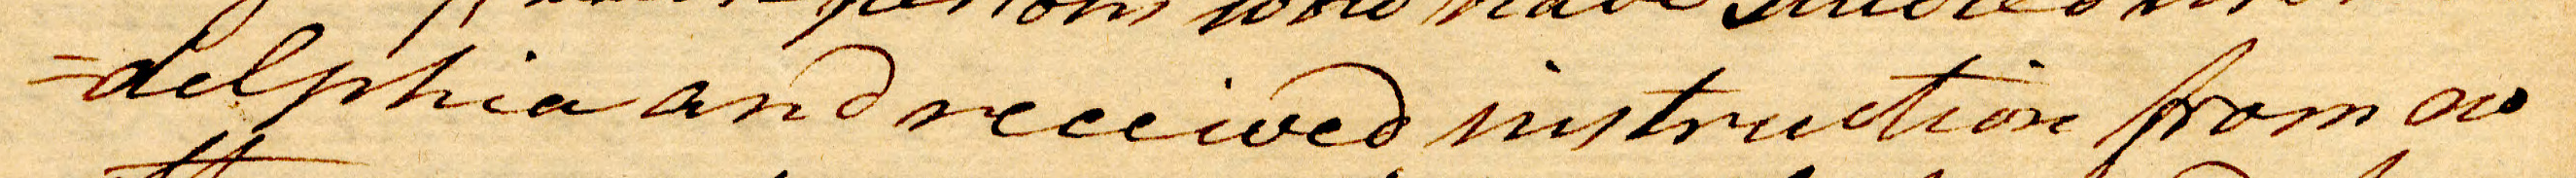-delphia and received instruction from no
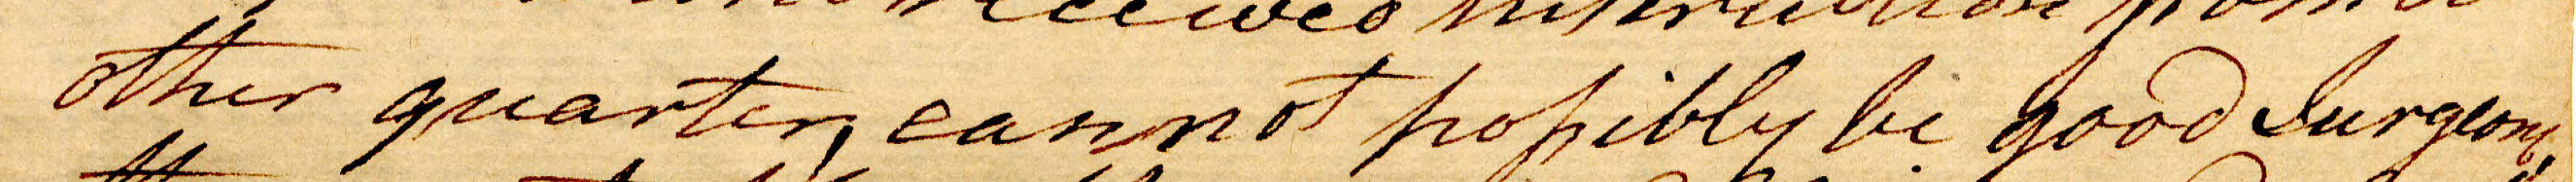other quarter, cannot possibly be good Surgeons,
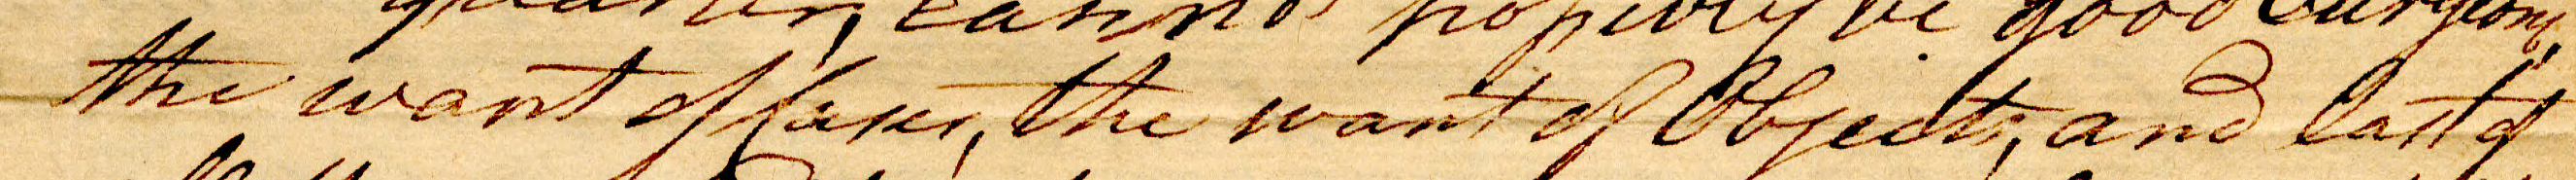the want of Cases, the want of Objects, and last of
